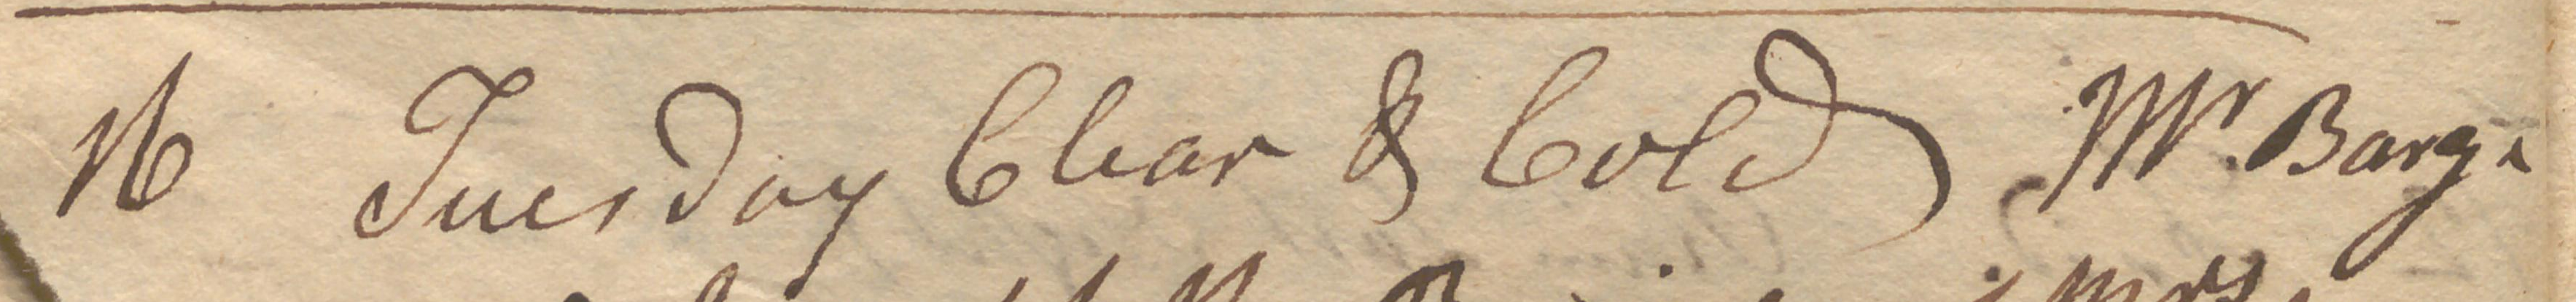16 Tuesday Clear & Cold M^r. Barg
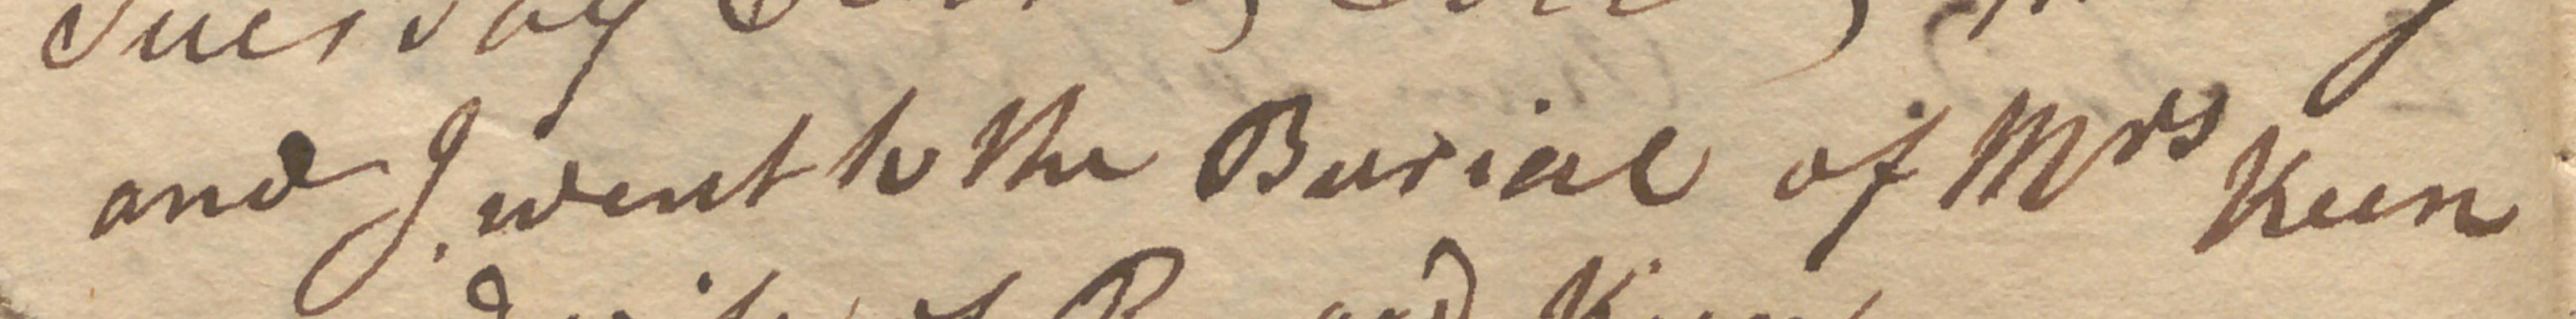and I went to the Burial of M^rs Kun
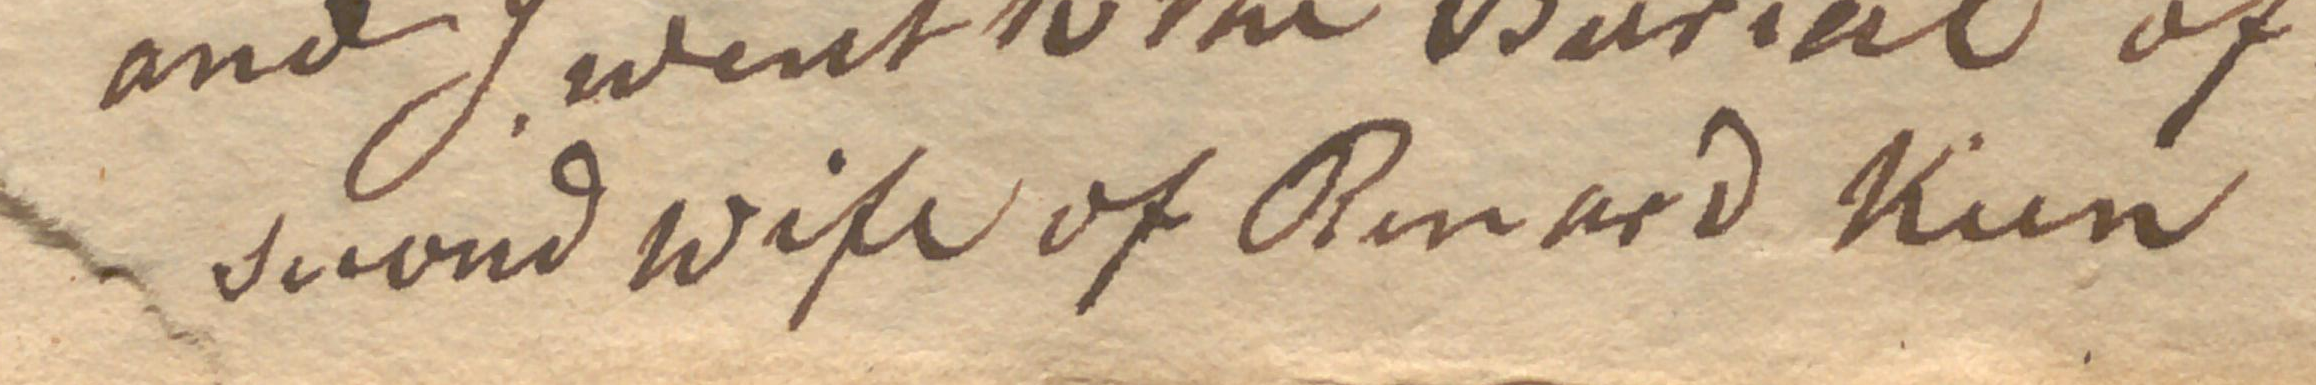second wife of Renard Kun
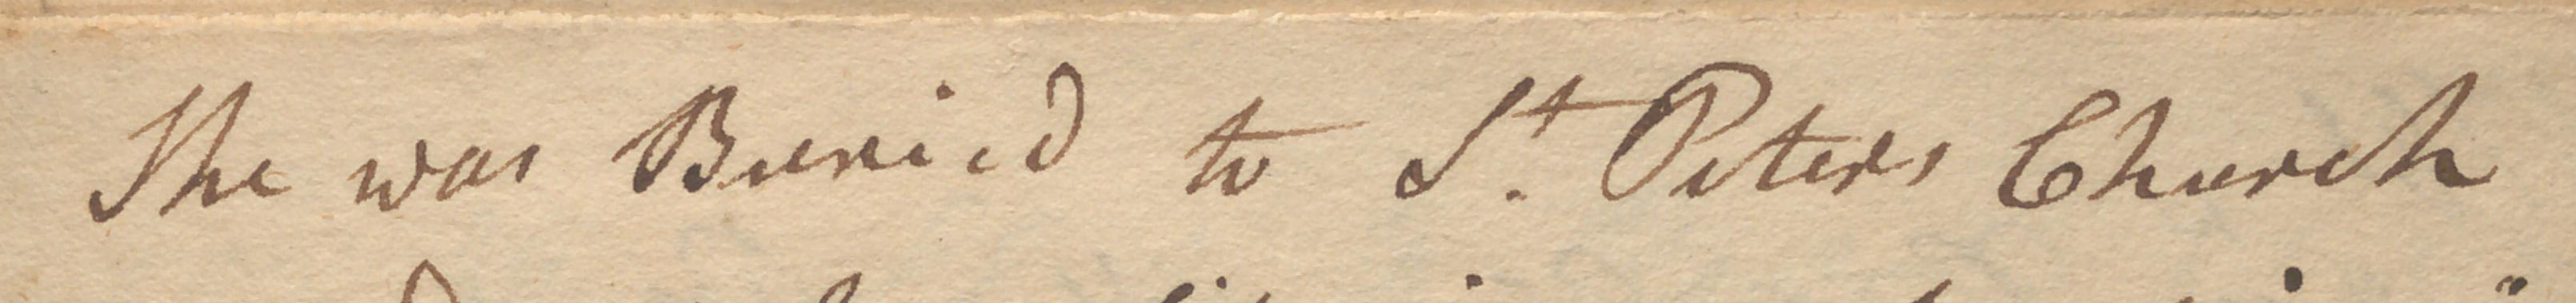she was Buried to S^t. Peters Church
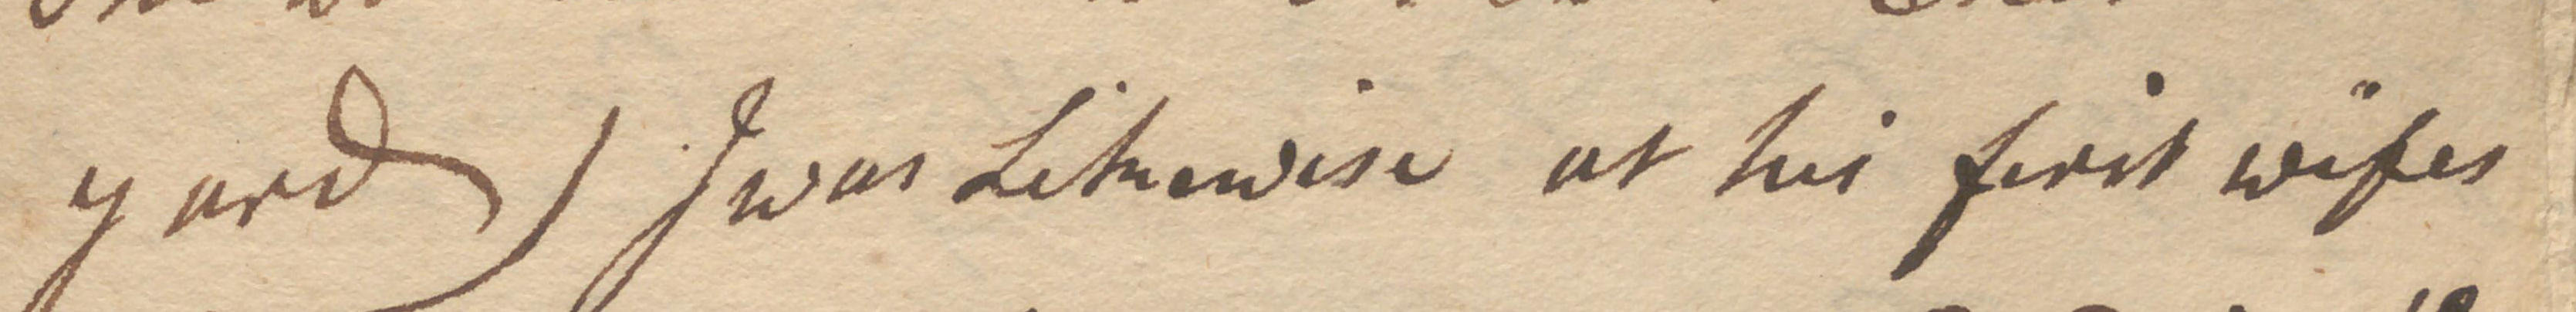yard/ I was Likewise at his first wifes
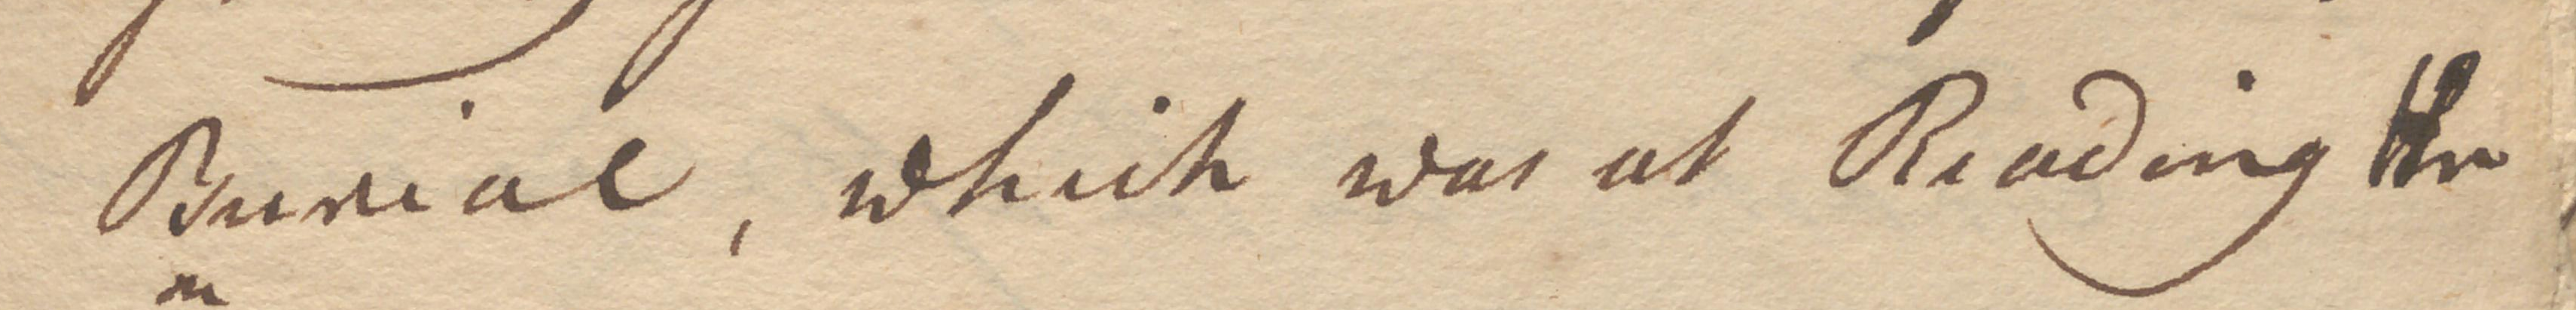Burial, which was at Reading the
